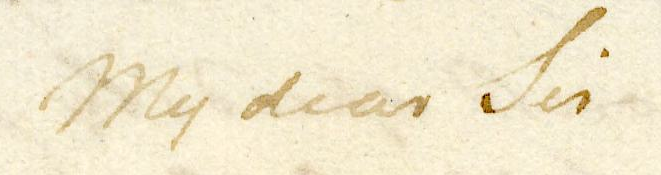My dear Sir
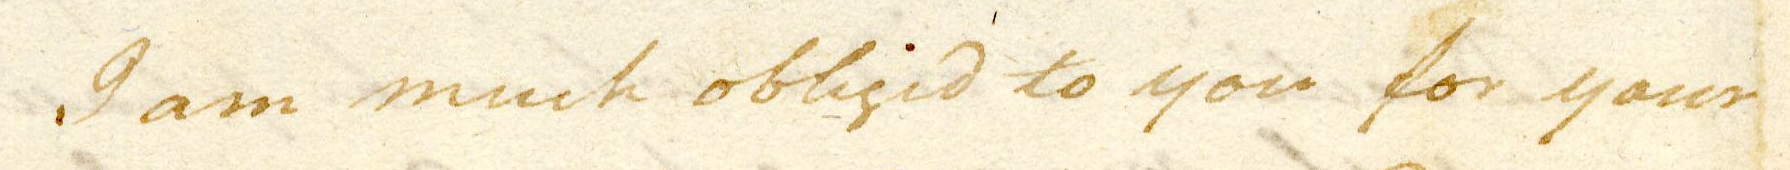I am much obliged to you for your
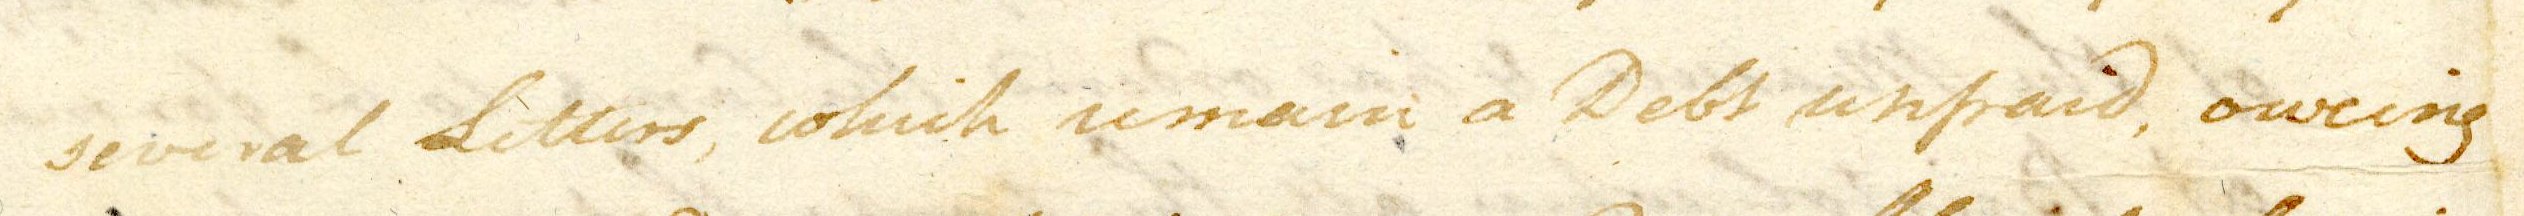several Letters, which remain a Debt unpaid, oweing
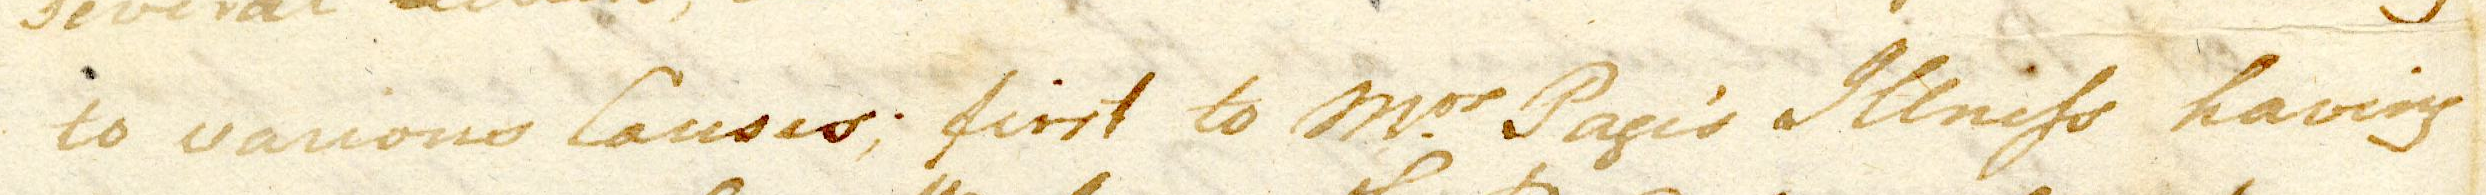to various Causes; first to M^rs. Page's Illness having
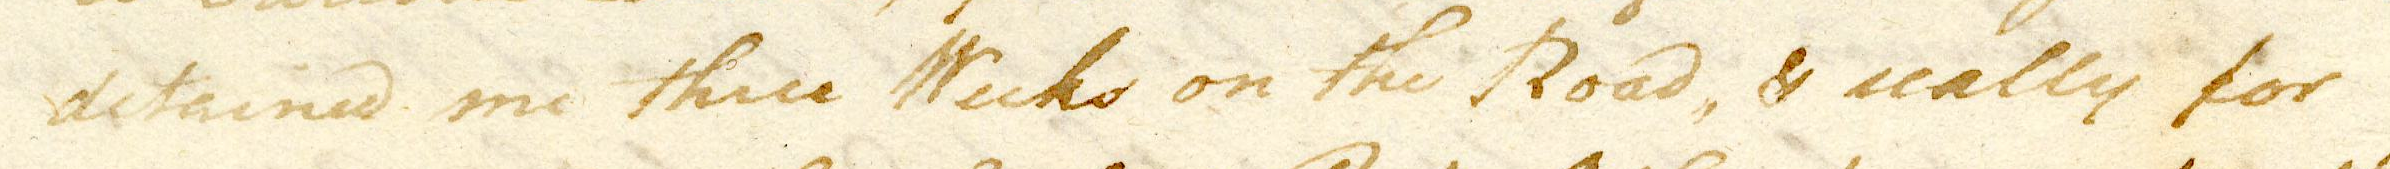detained me three Weeks on the Road, & really for
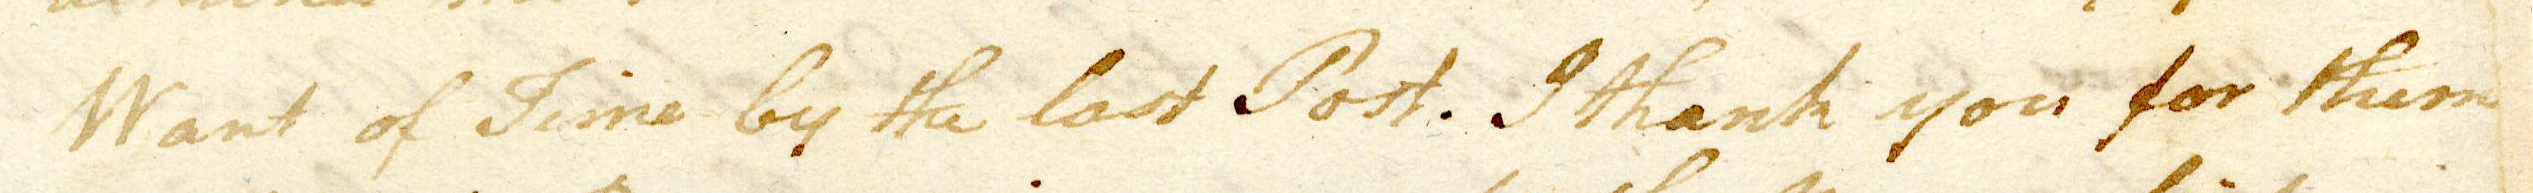Want of Time by the last Post. I thank you for them
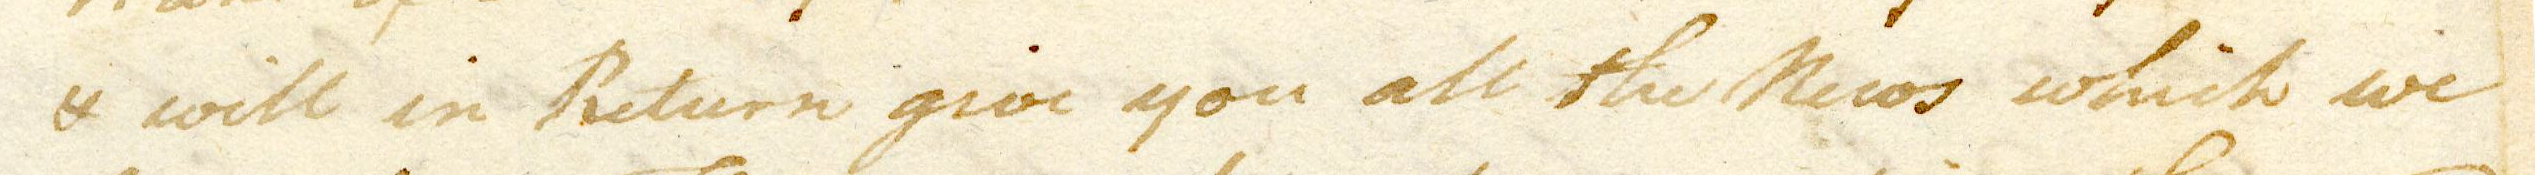& will in Return give you all the News which we
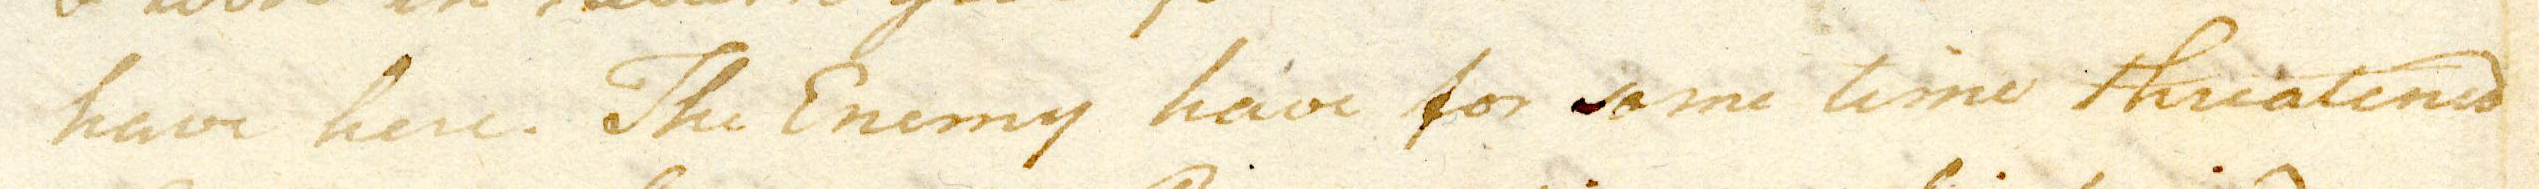have here. The Enemy have for some time threatened
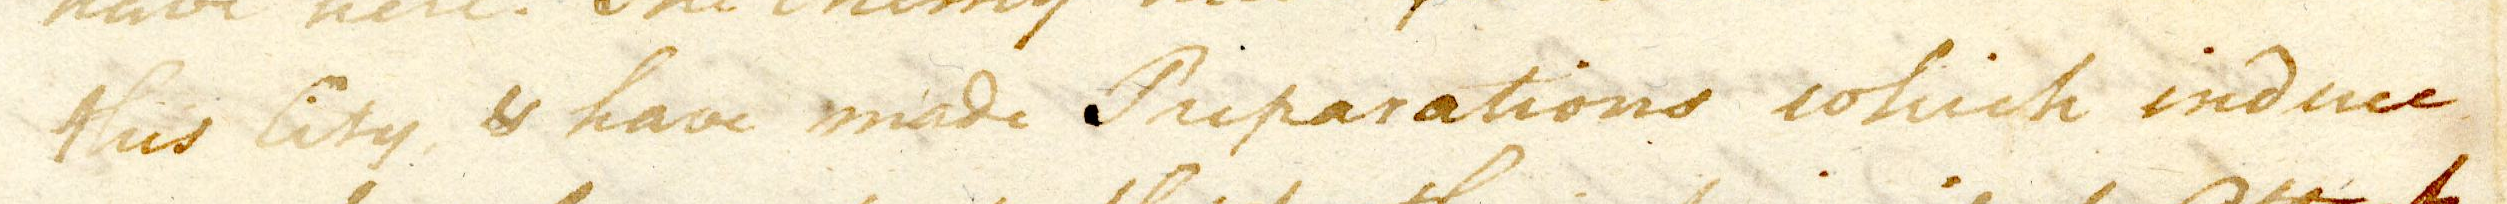this City & have made Preparations which induce
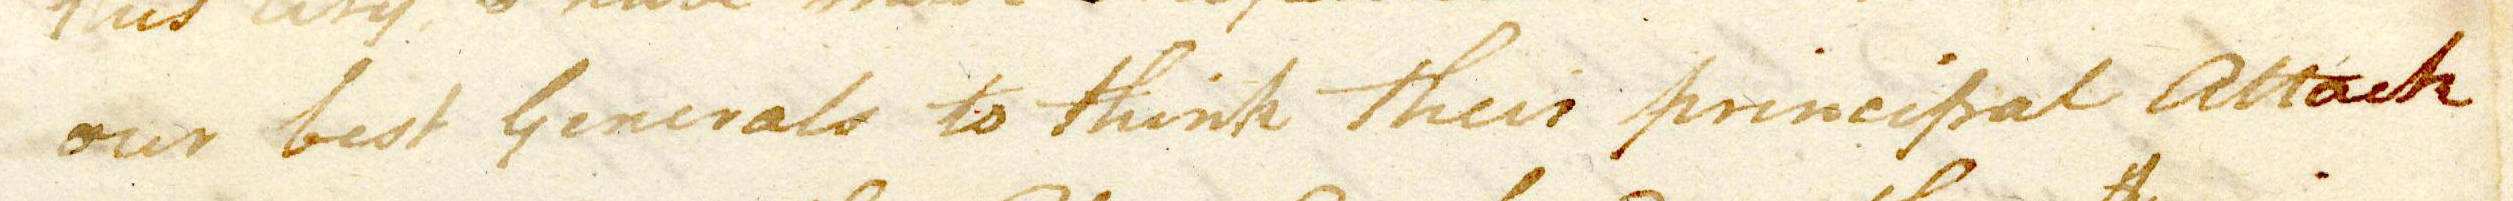our best Generals to think their principal Attack
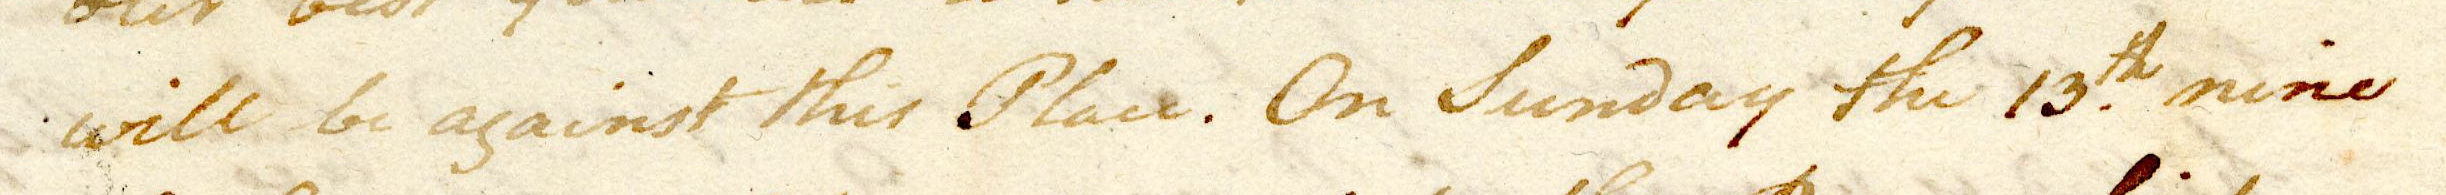will be against this Place. On Sunday the 13^th. nine
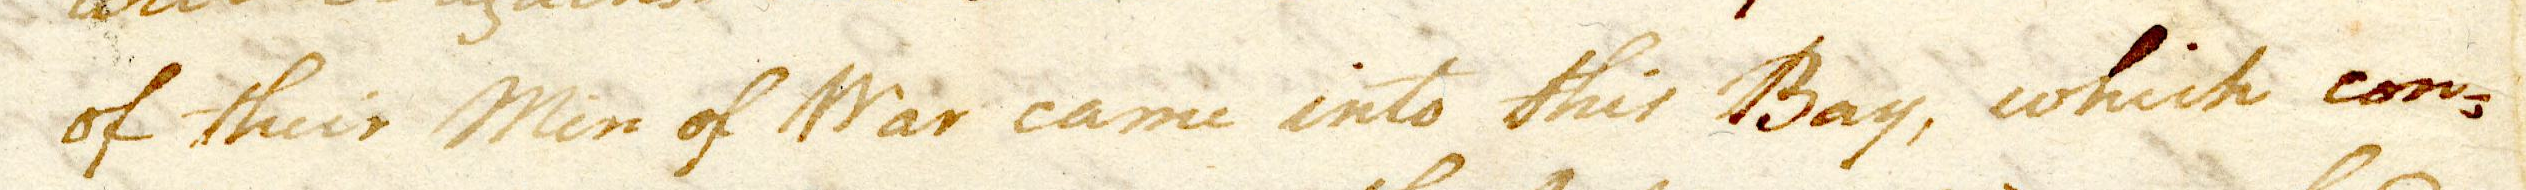of their Men of War came into this Bay, which con-
